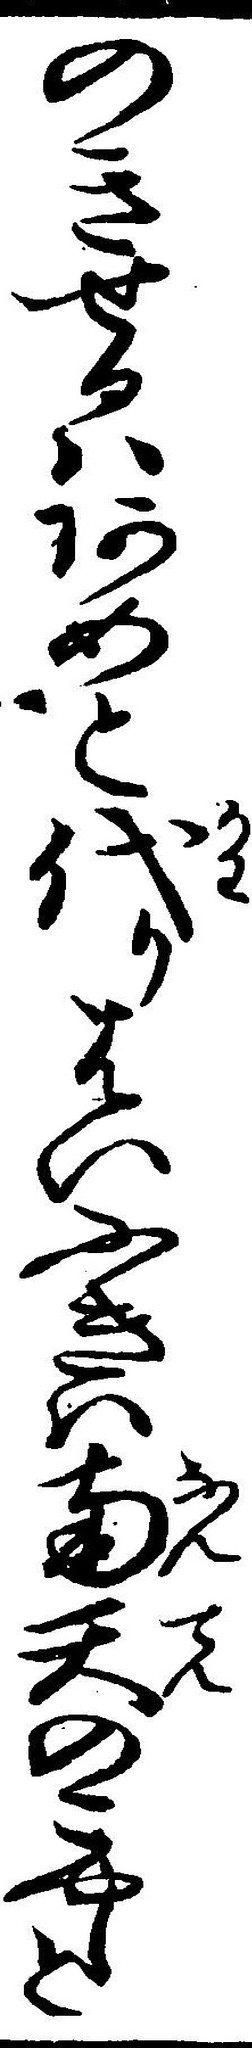のきせるはあめと代りはいふきは南天のこやしと
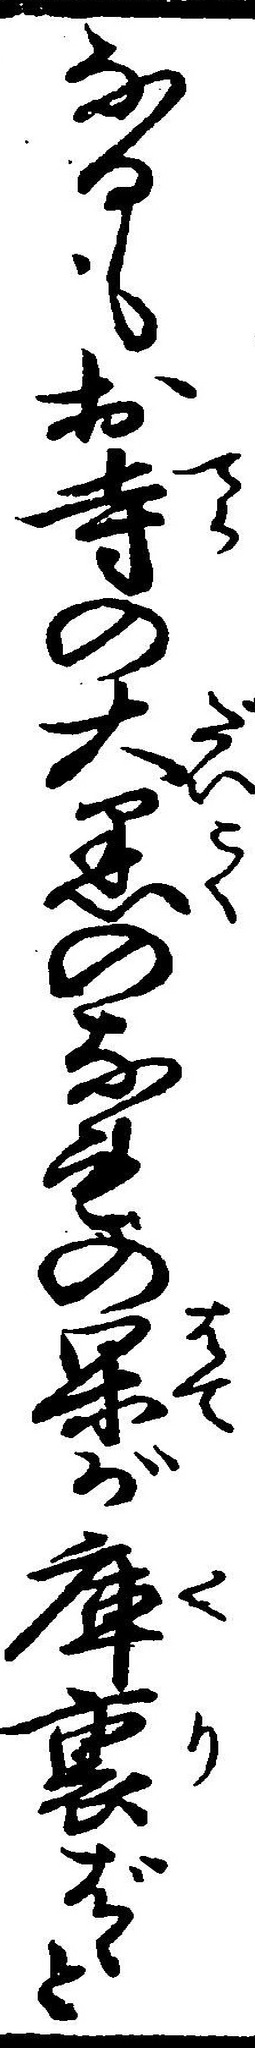なるもお寺の大黒のなれの果が庫裏ばゞと
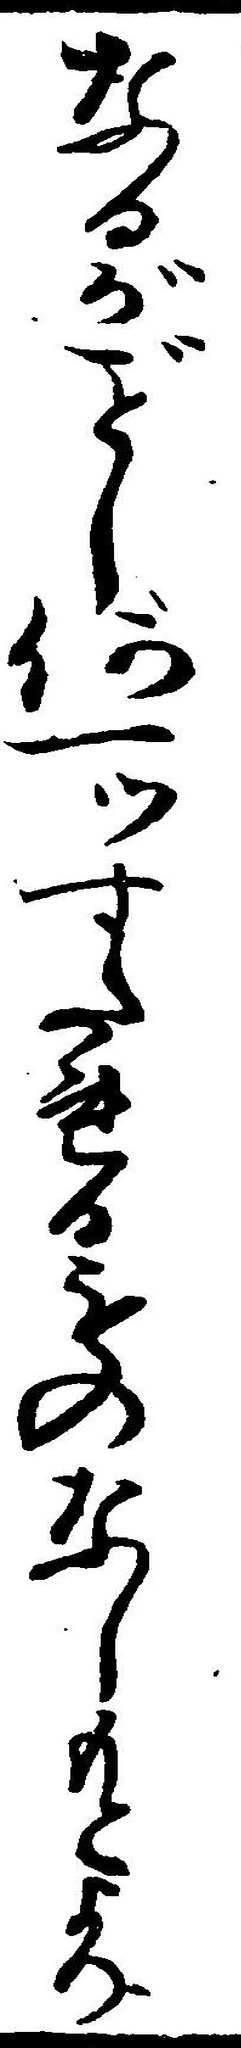なるがごとし何一ッすたれるものなしもとより

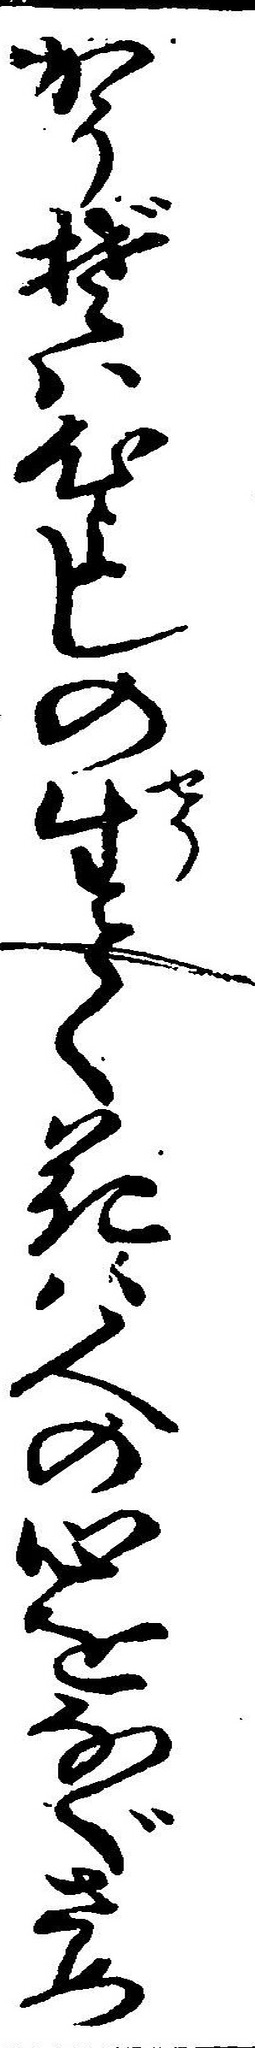かうぞは心よしの生とく花は人の心をなぐさめ
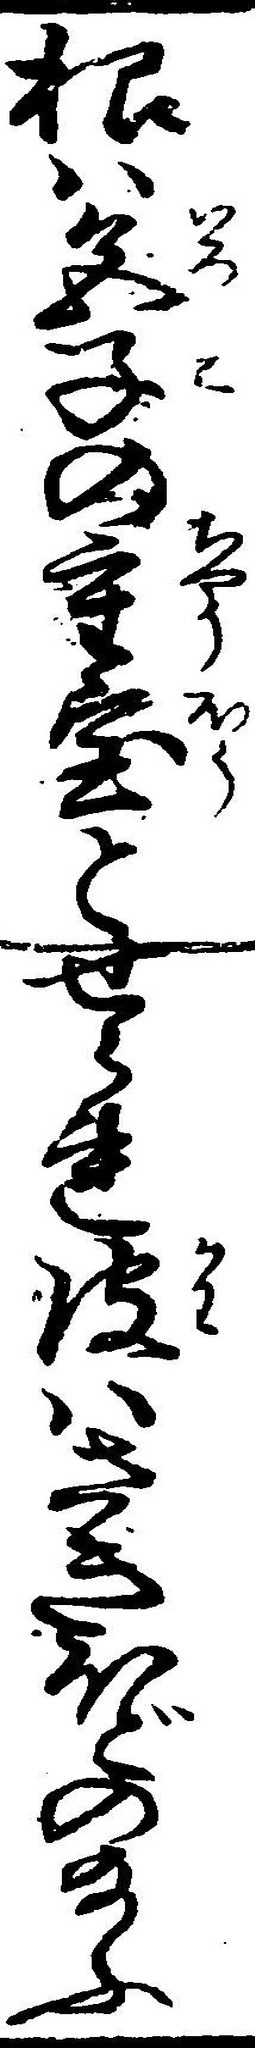根は色子の重宝とせられ皮はさきほどの給ふ
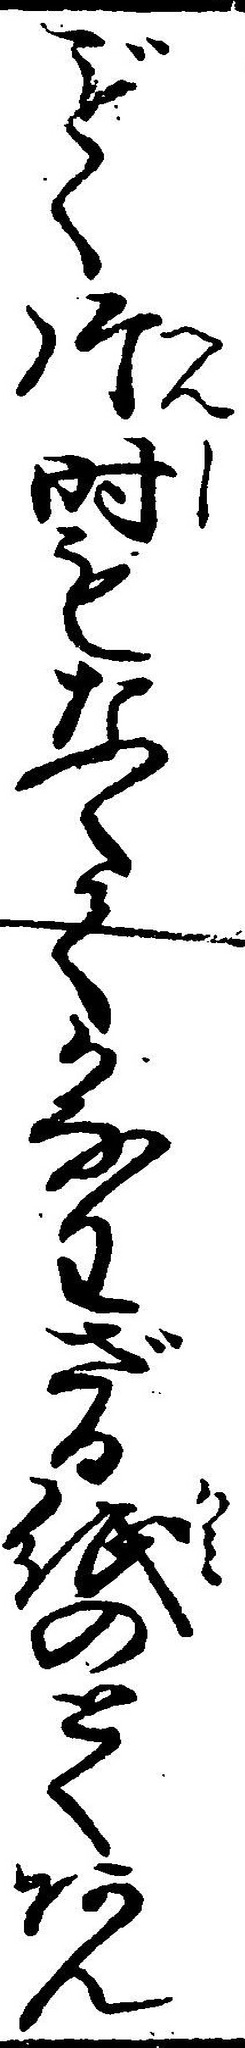ごとく片時もなくてかなわざる紙のとくあん
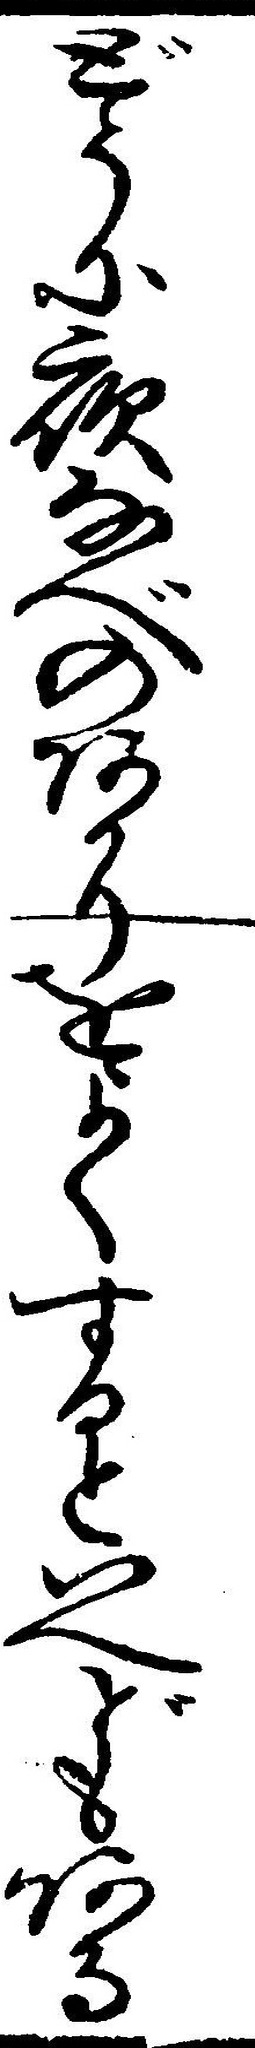どうに夜なべのあかりをよくするといへどもある
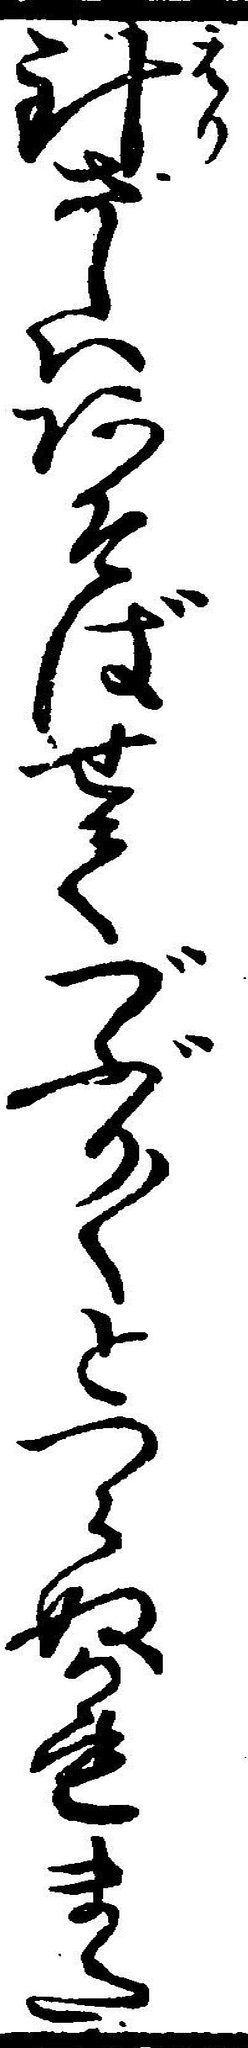針さしはあそばせてづぶり〳〵とつらぬかれまた
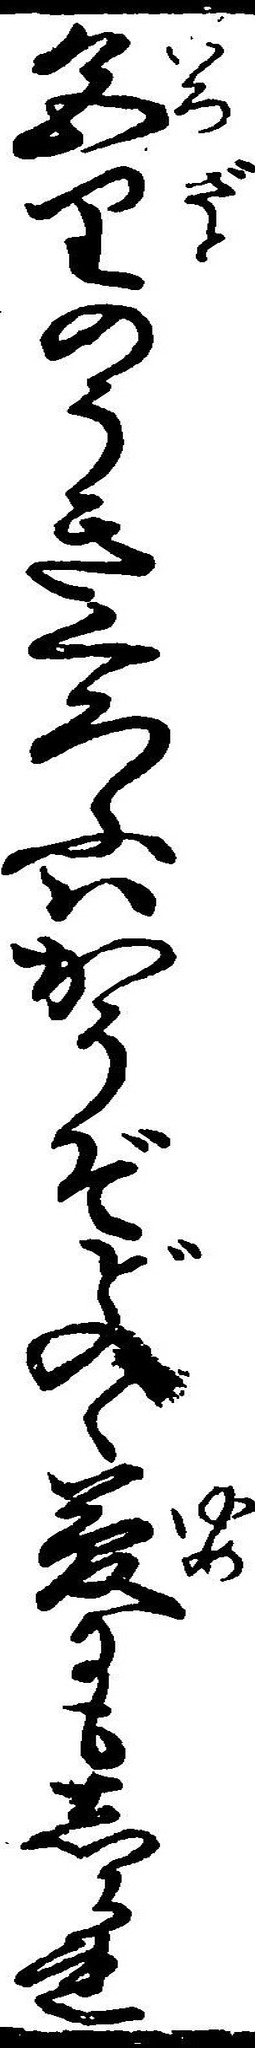色里のうきくろうはかうぞどのゝ夢にもしられ
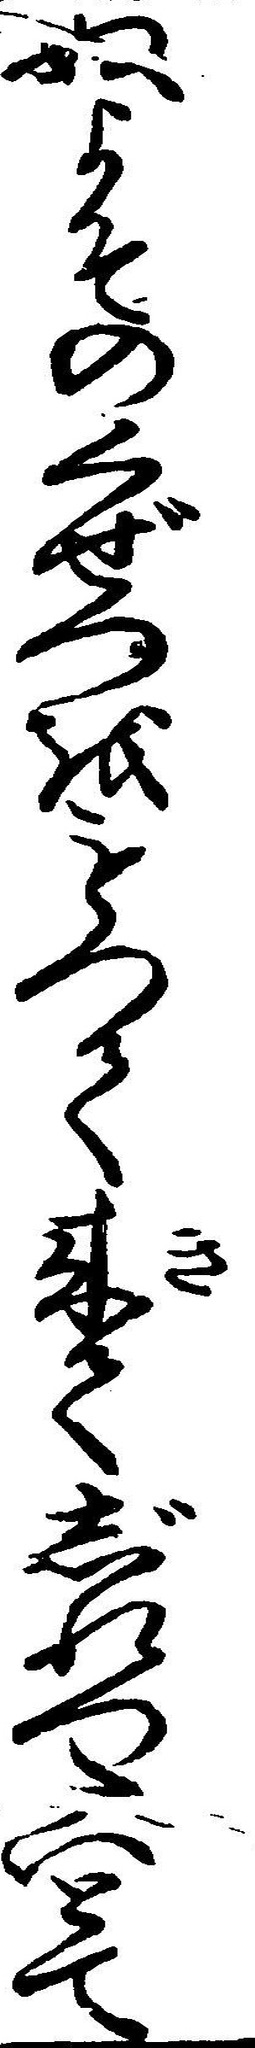ぬよそのくぜつをもつて来てじれつたいとて
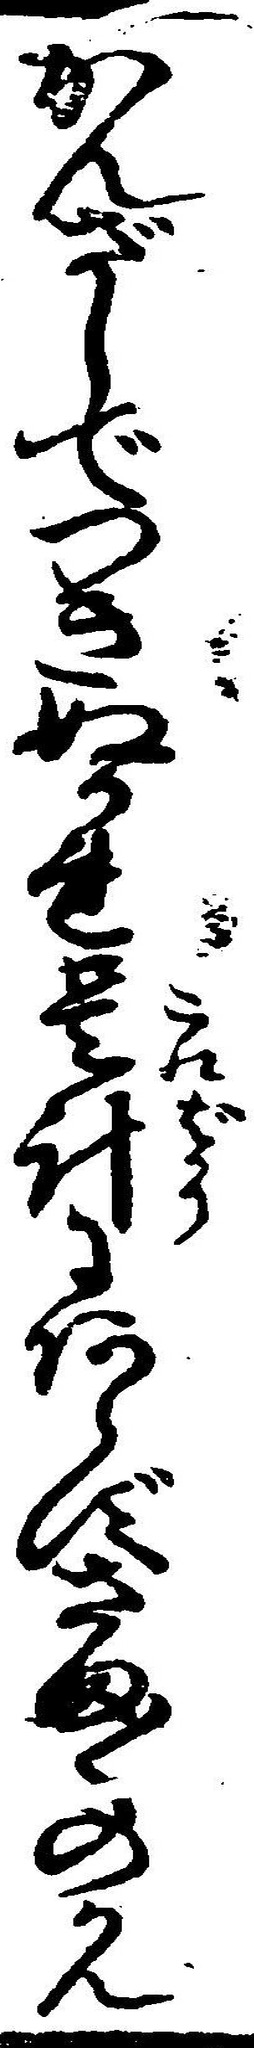かんざしでつきぬかれ是計にあらずさま〳〵のかん
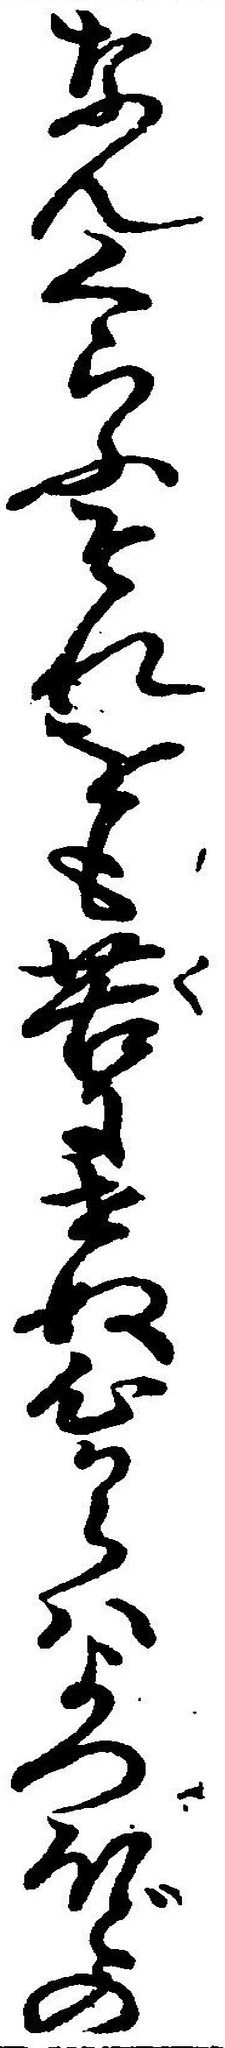なんくらふそれをも苦にせぬ心からよつほどの
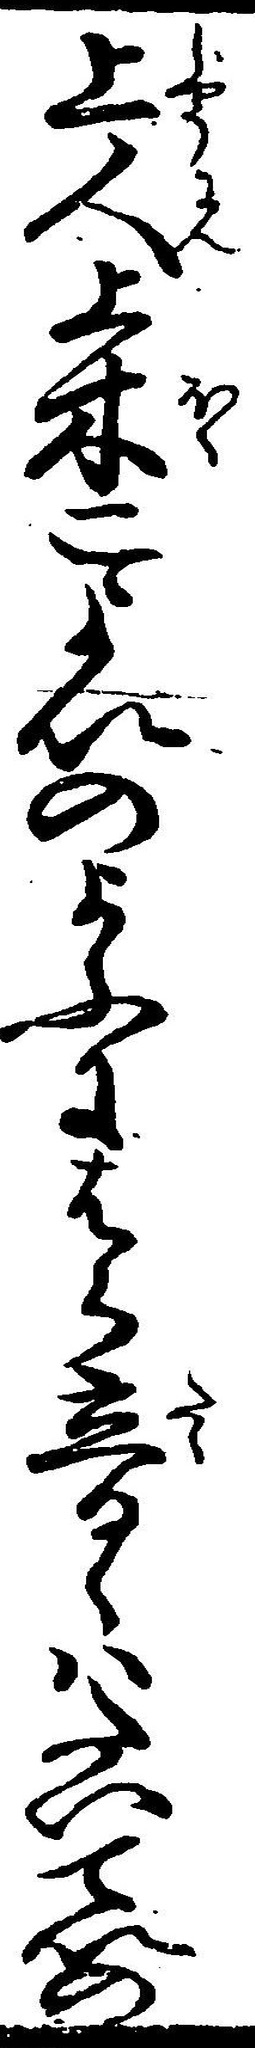上人上木こよいのよふにはら立るゝはたいていの
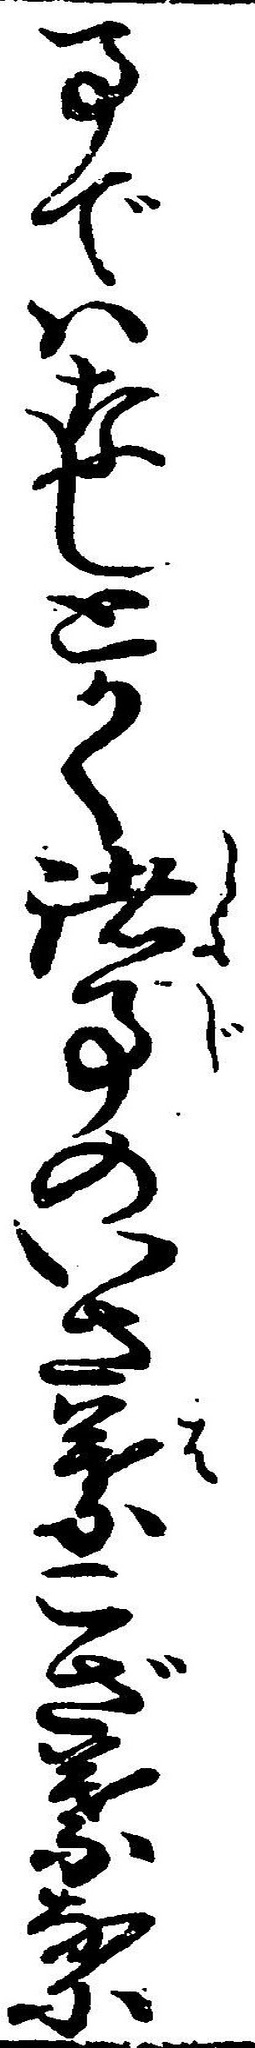事ではなしとかく諸事のいさ葉こざ葉なに
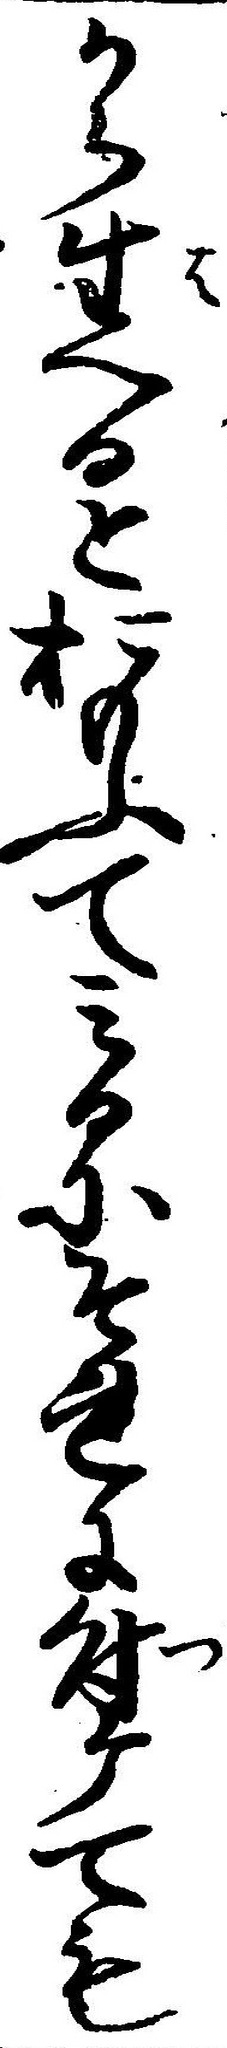から生へるとおもふてみるにそれに付
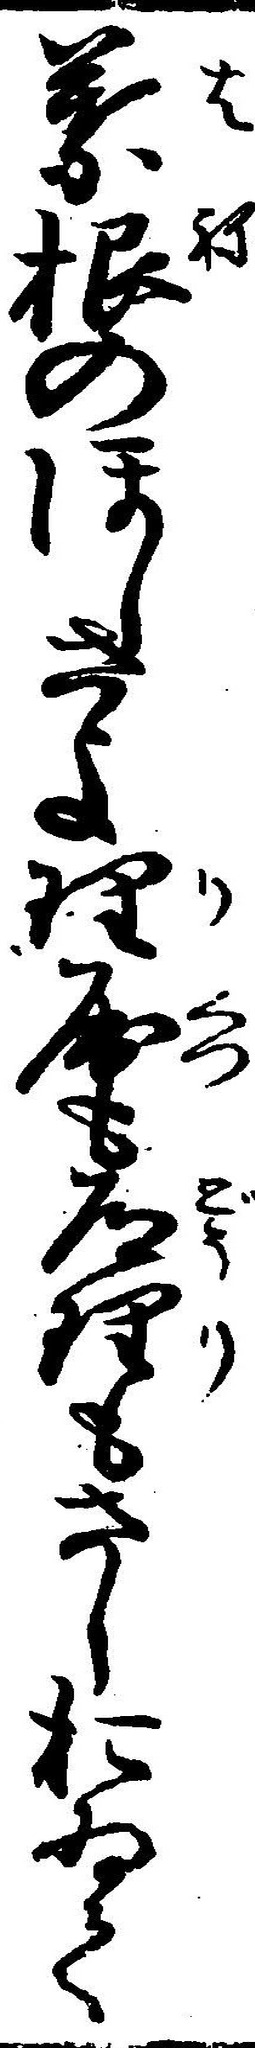葉根のほしさよ理屈も道理もさしおゐて
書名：草木芝居化物退治 / 泉花堂三蝶(十六兵衛)作
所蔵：東京大学総合図書館 General Library in the University of Tokyo, JAPAN
